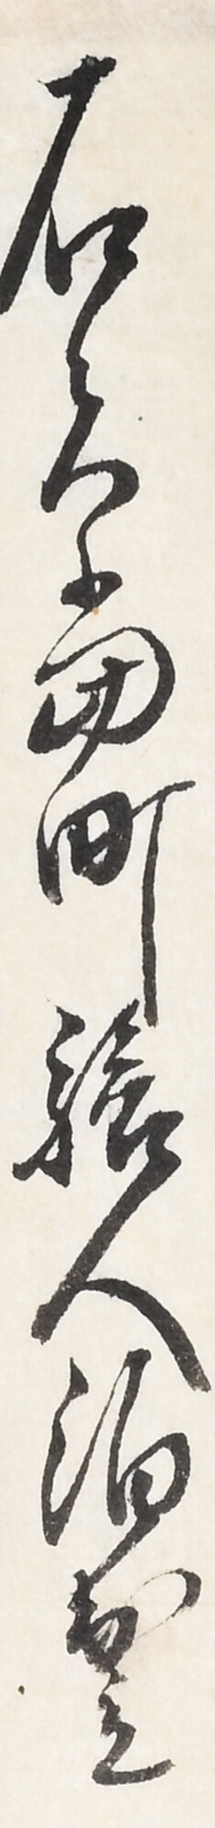右者当町旅人泊出立
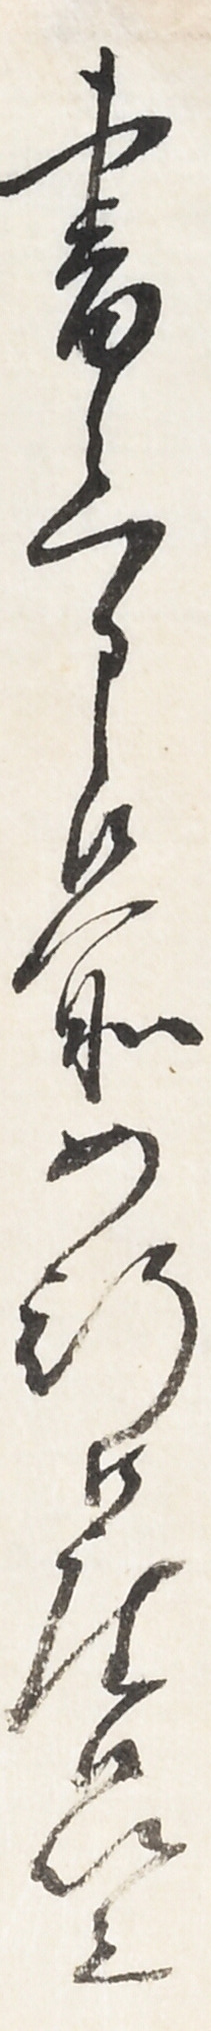書上申候所如斯御座候以上
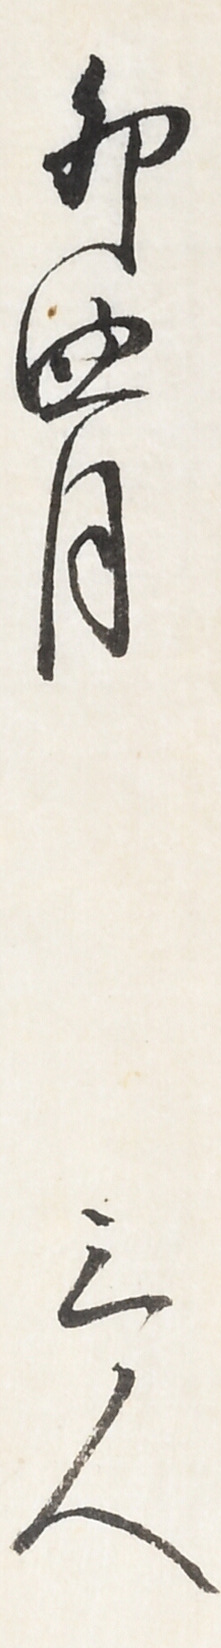卯四月三人
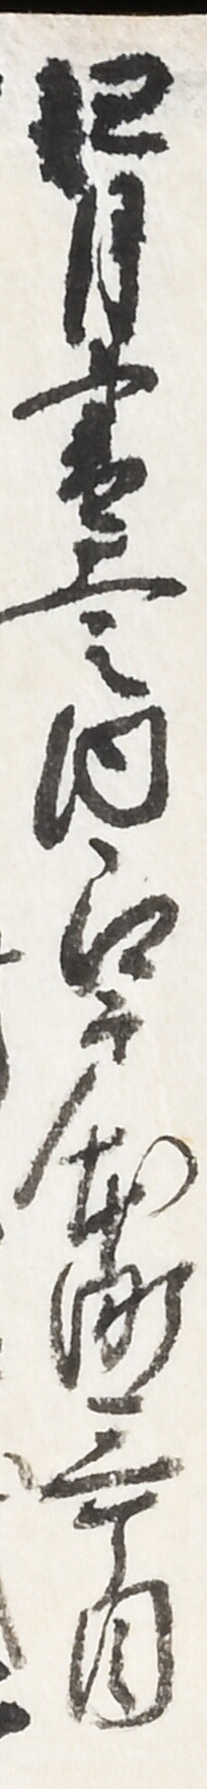四月書上之内江戸本町三丁目
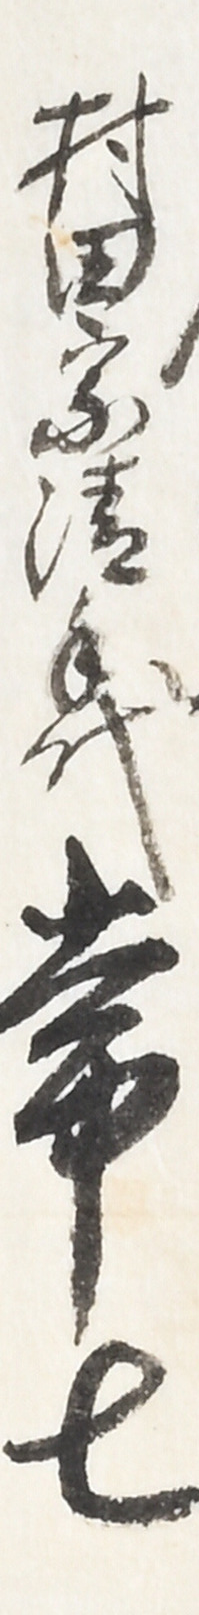一村田宗清手代常七
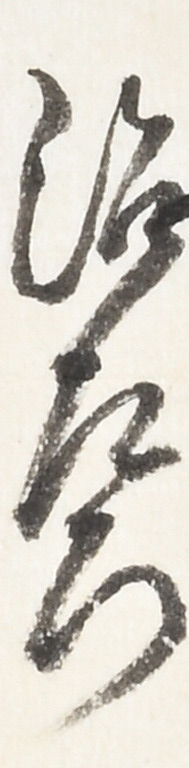治左衛門
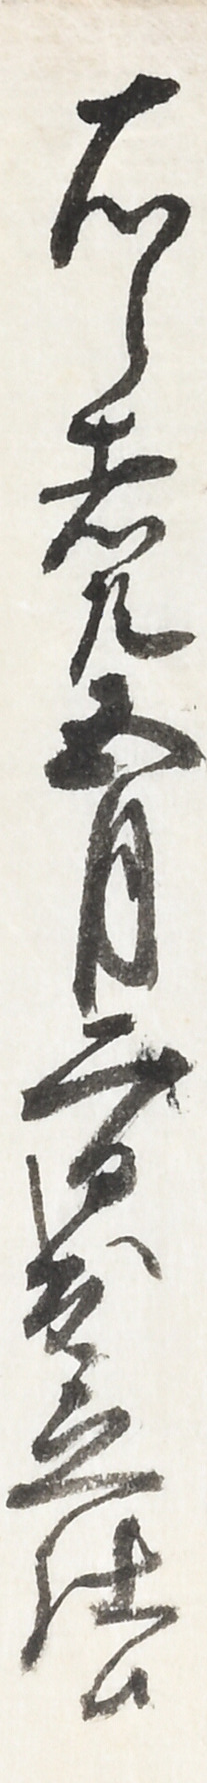右之者共五月二日出立仕候
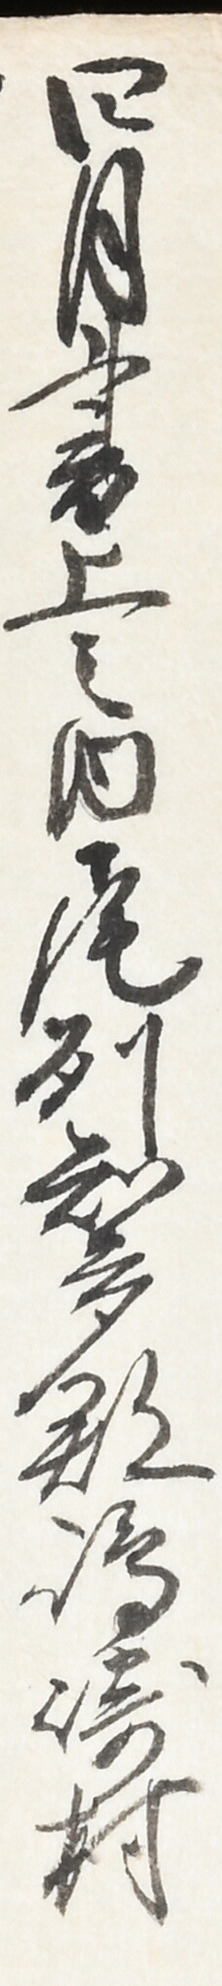四月書上之内尾州知多郡嶋崎村
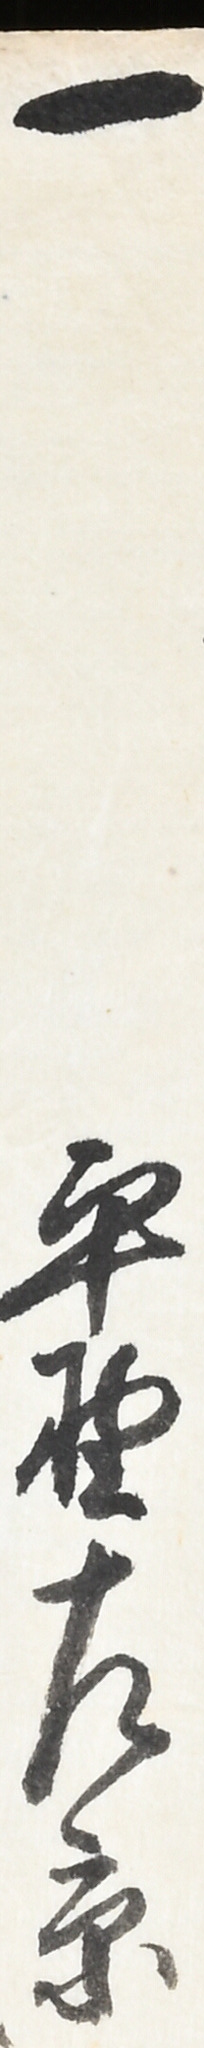一平野左京
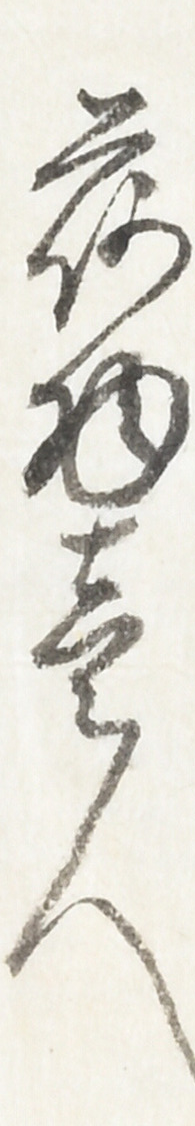荷物壱人
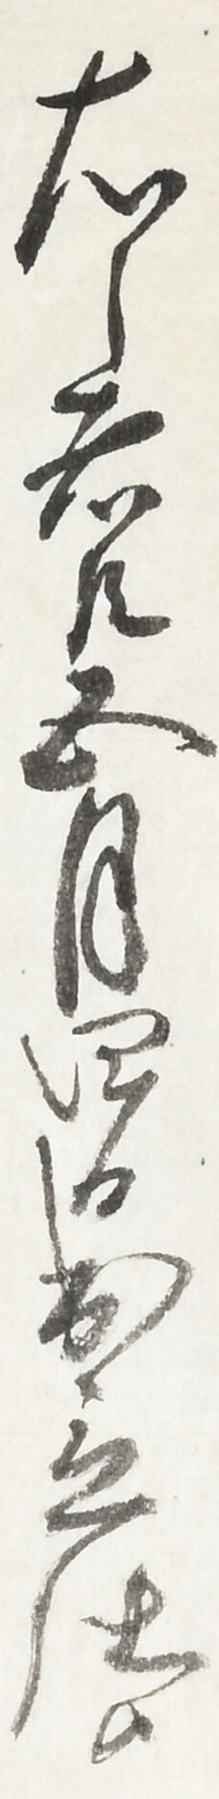右之者共五月四日出立仕候

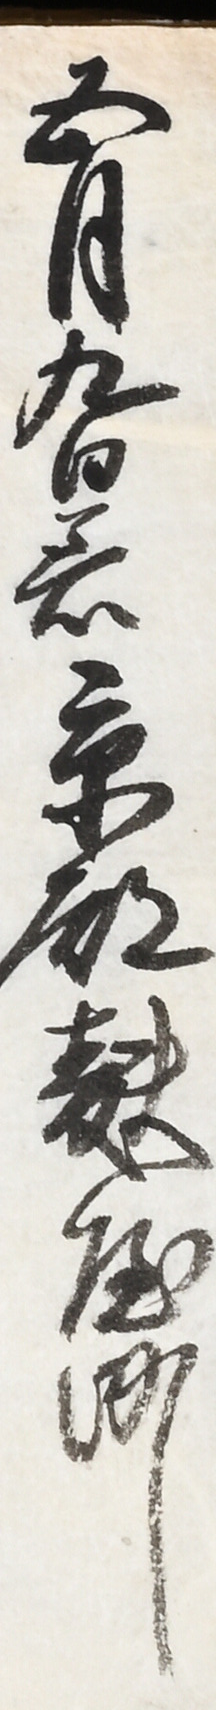五月九日着京都麩屋町
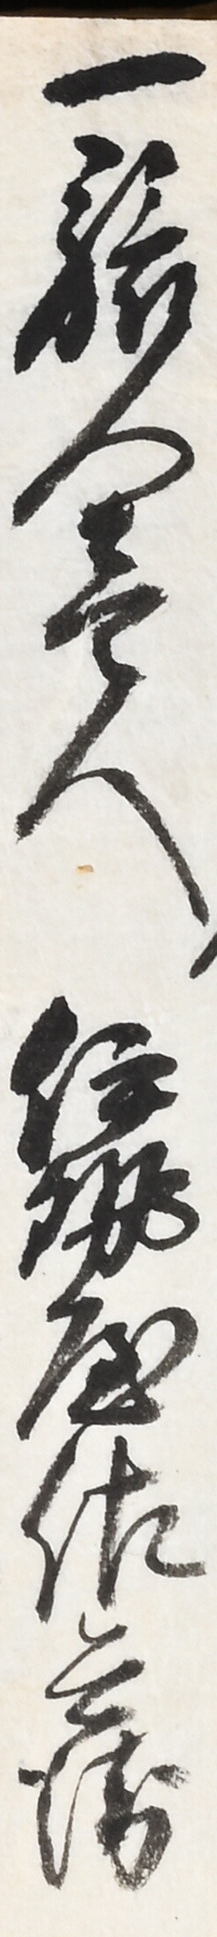一旅人壱人伊勢屋佐兵衛
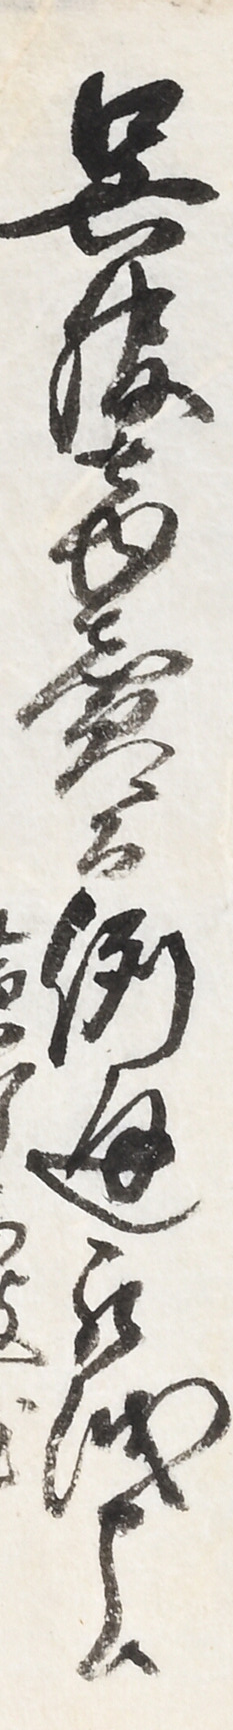呉服商売ニ而例年罷越申候
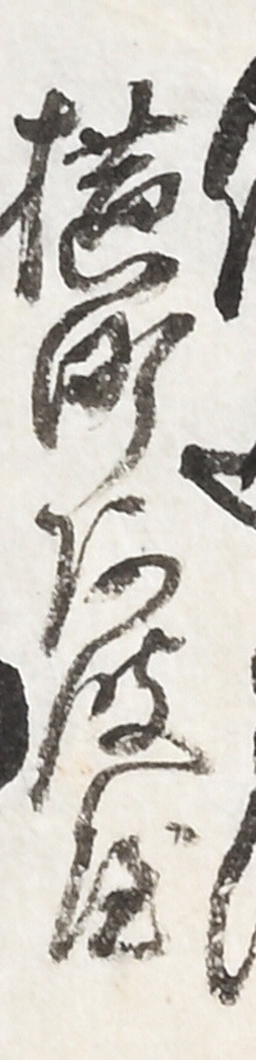横町阿波屋
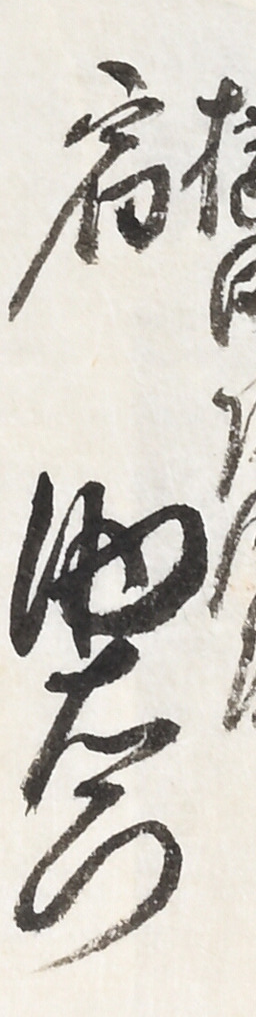宿助右衛門
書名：旅人泊控帳
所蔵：伊那市立高遠町図書館・合同会社AMANE
